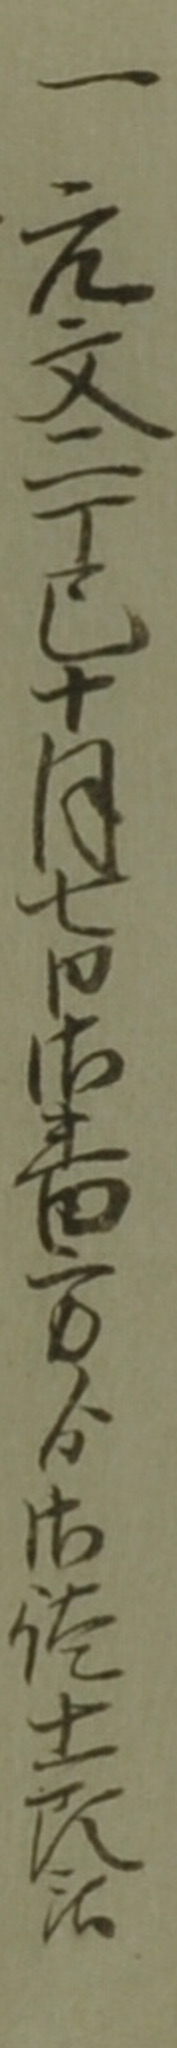一元文二丁巳十月七日御番方ゟ御徒士頭被
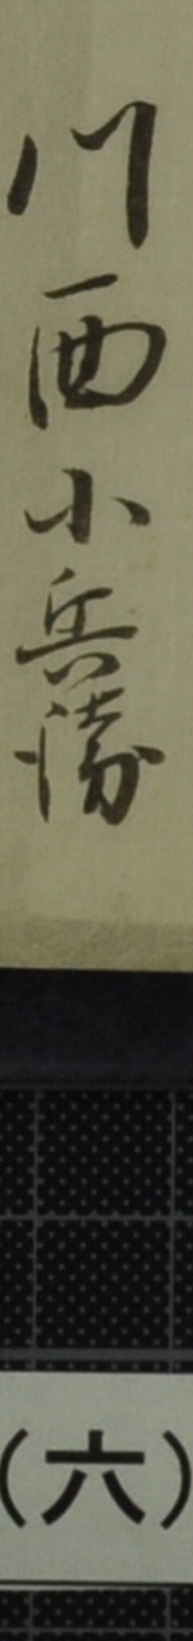川面小兵衛
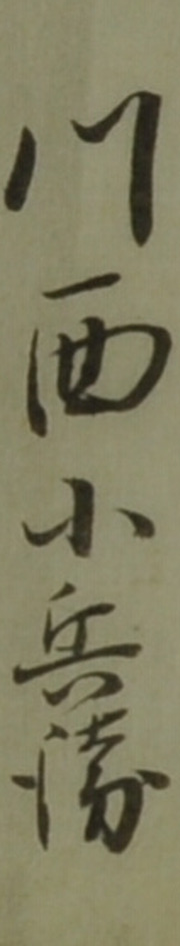川面小兵衛
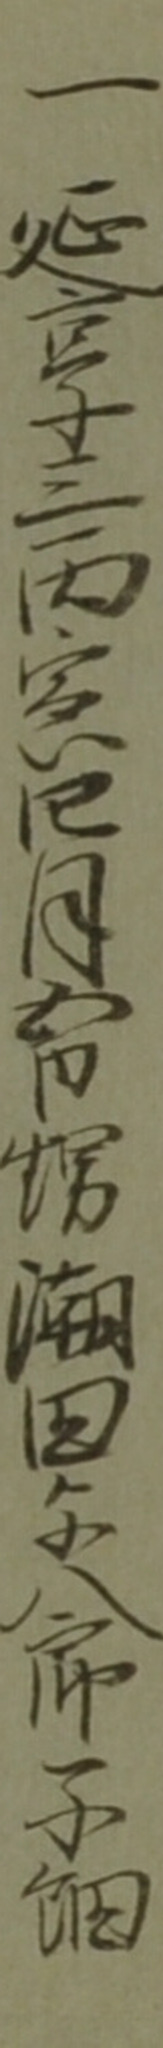一延享三丙寅四月五日甥潮田与八郎子細
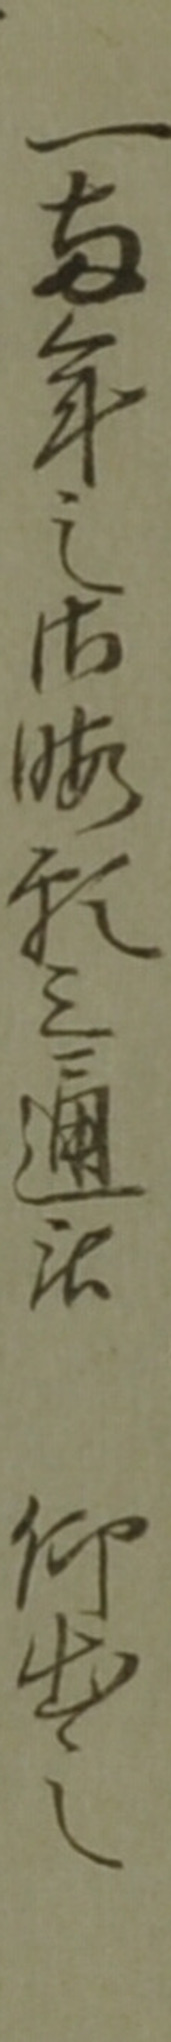一両年之御暇願之通被仰出之
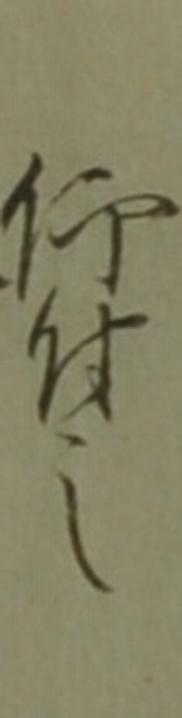仰付之
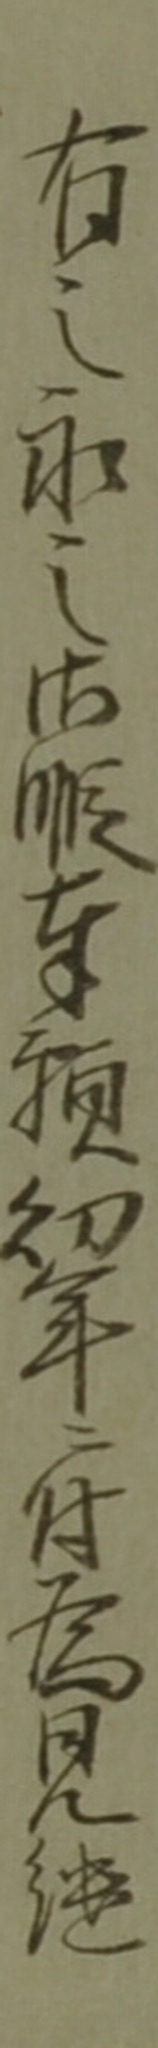有之永之御暇奉預幼年ニ付為見繾
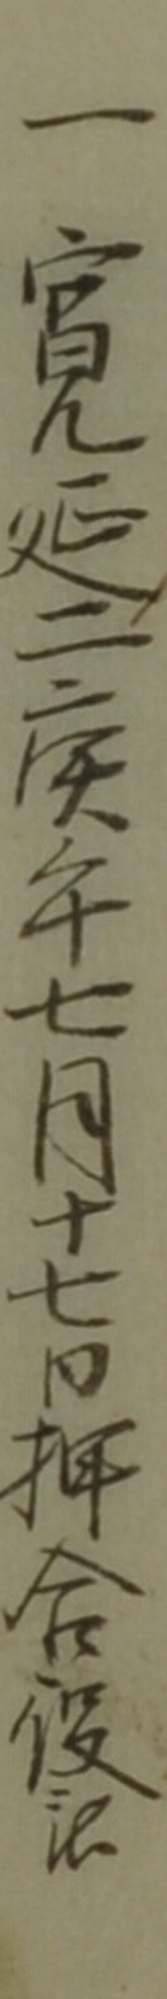一寛延二庚午七月十七日押合役被
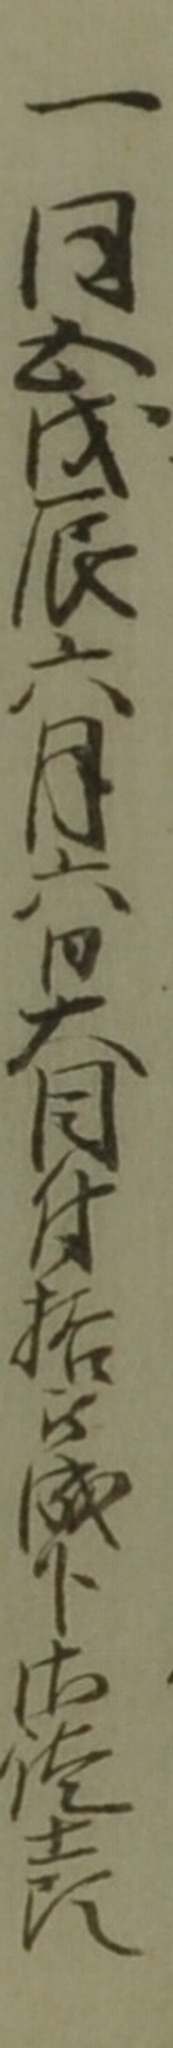一同五戊辰六月六日大目付被成下御徒士頭
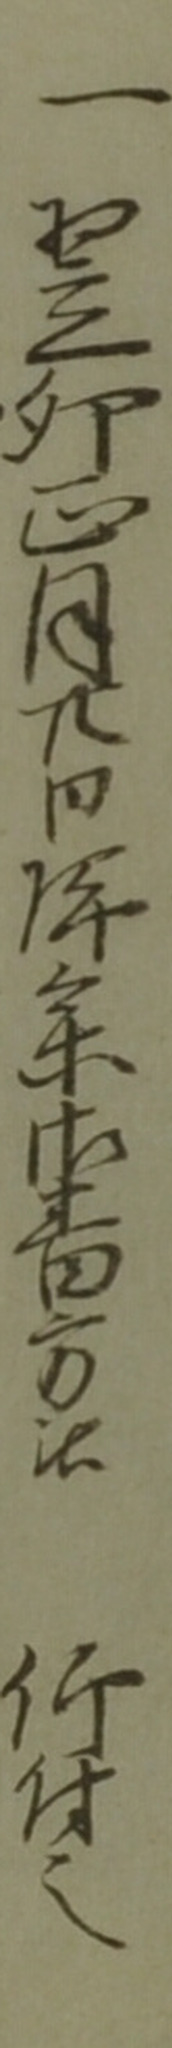一翌卯正月廿日帰参御番方被仰付之
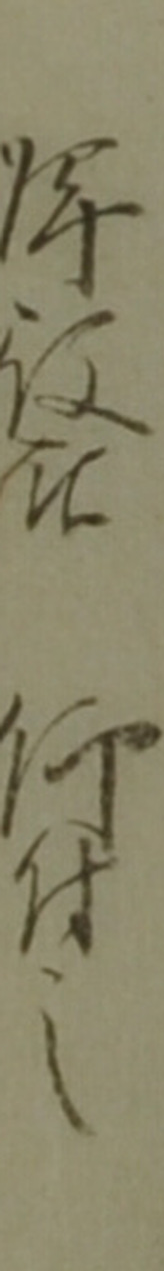帰役被仰付之
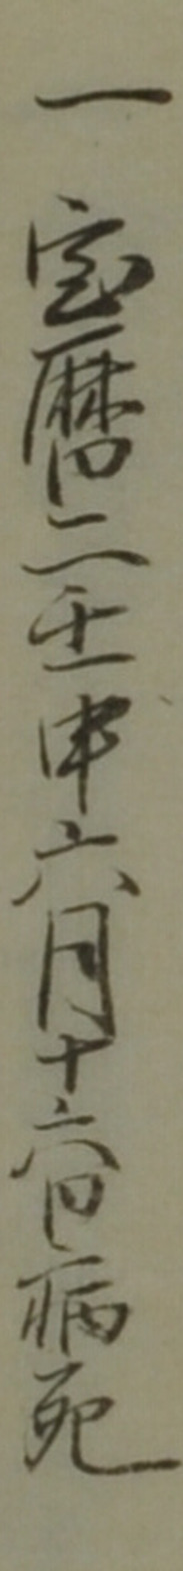一宝暦二壬申六月十六日病死
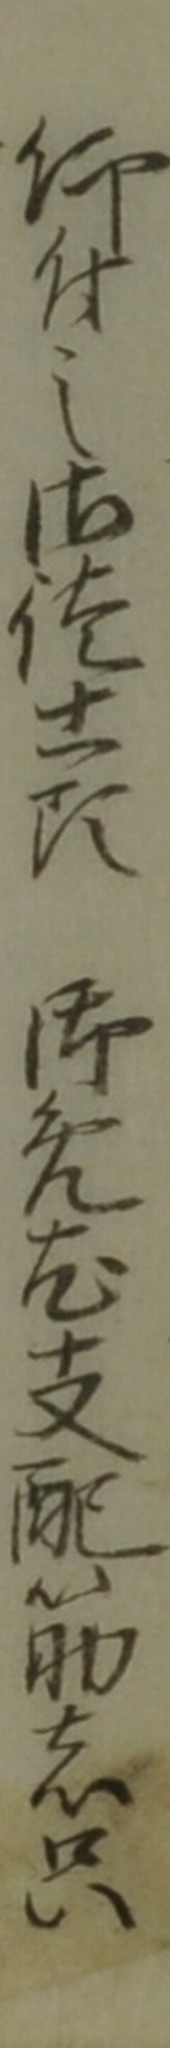仰付之御徒士頭御免尤支配筋者只
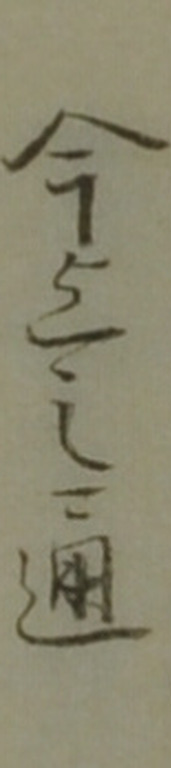今迄之通
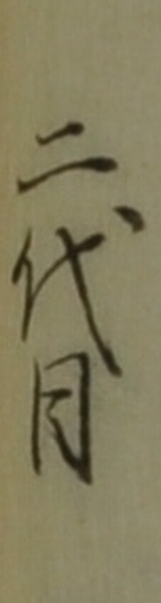二代目
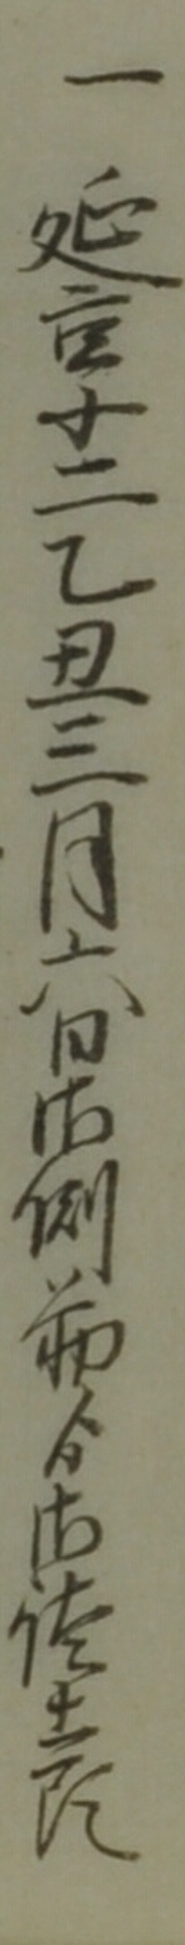一延享二乙丑三月六日御側勤ゟ御徒士頭
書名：諸御役代々録（六）
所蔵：伊那市立高遠町図書館・合同会社AMANE
